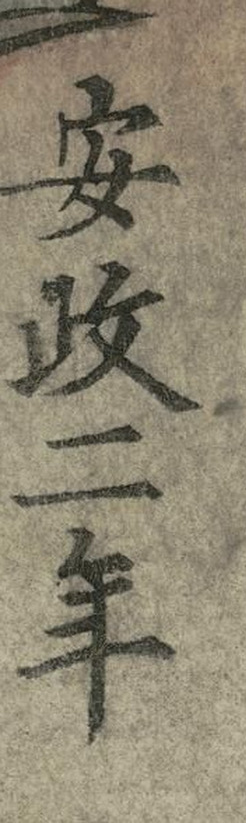安政二年
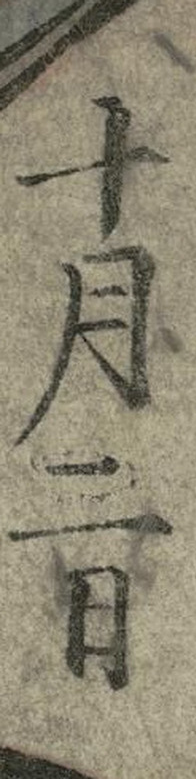十月二日

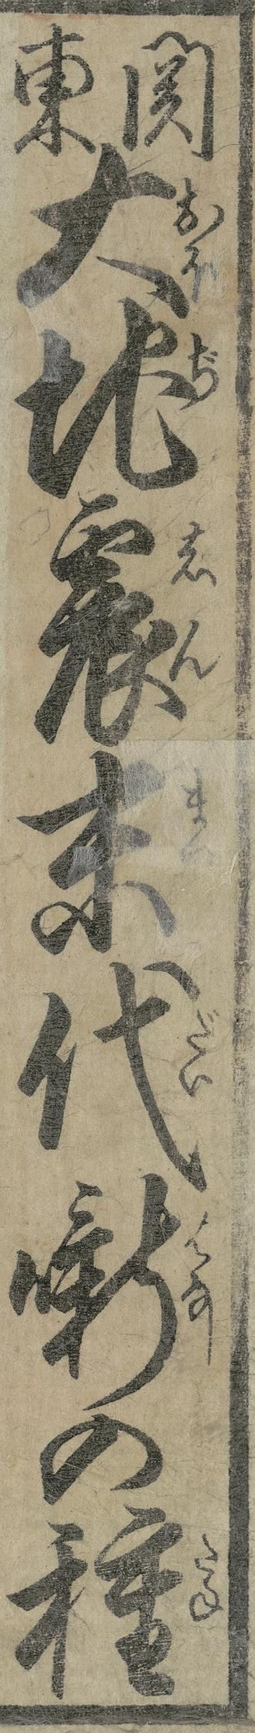関東大地震末代噺の種
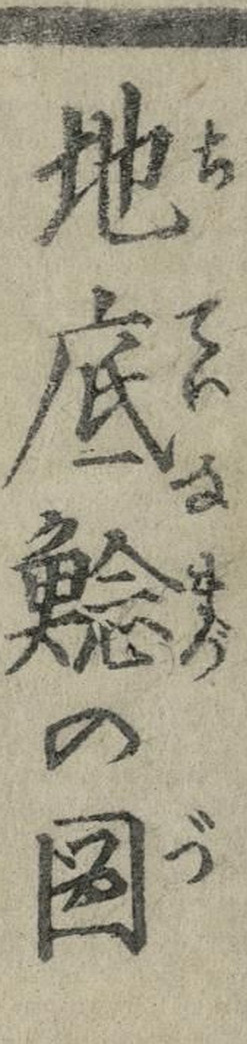地底鯰の図
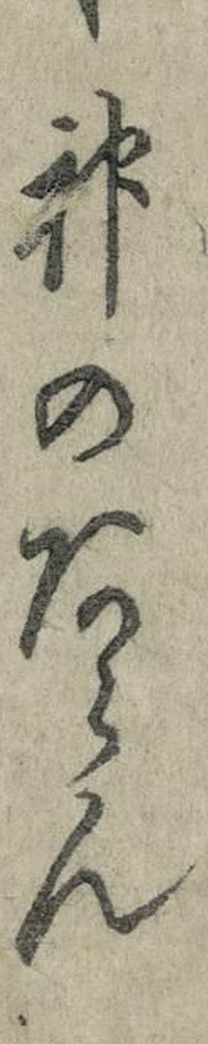神のあらん
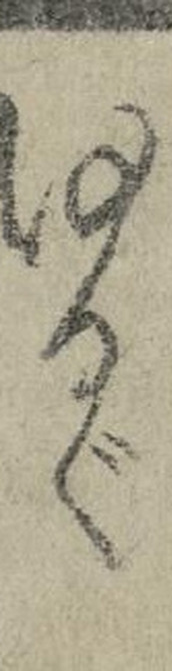ゆるぐ
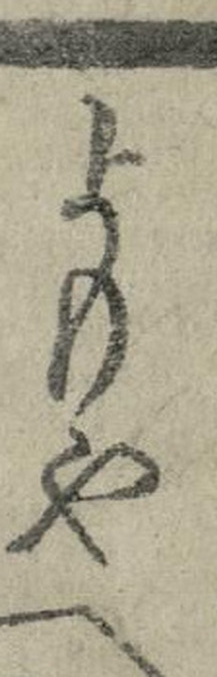よもや
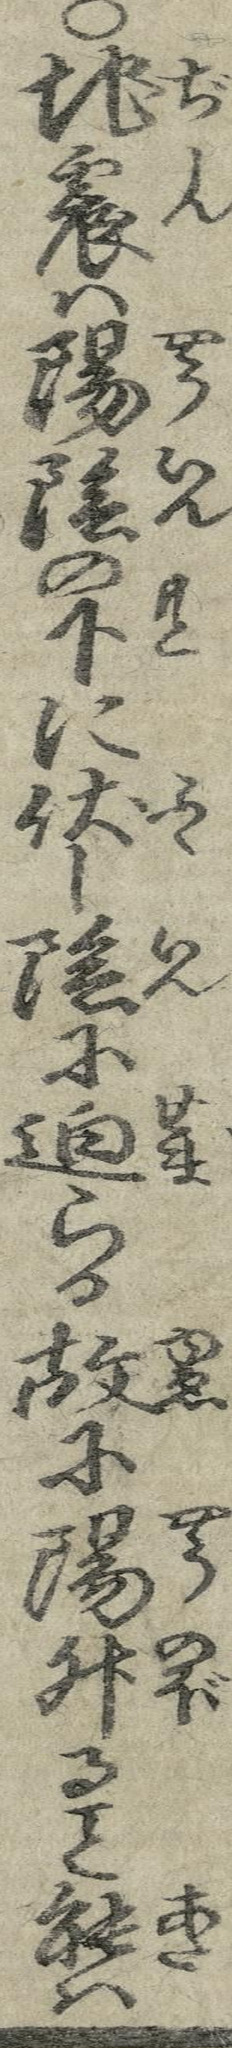○地震は陽陰の下に伏し陰に迫らる故に陽昇ること能は
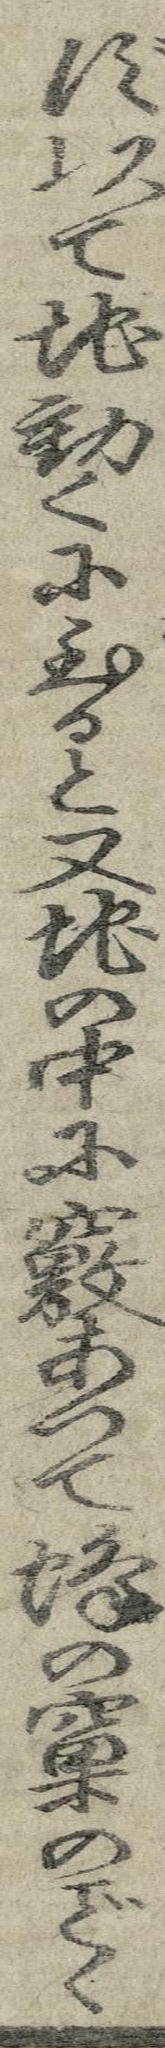ず以て地動くに至ると又地の中に竅あつて蜂の巣のごとく
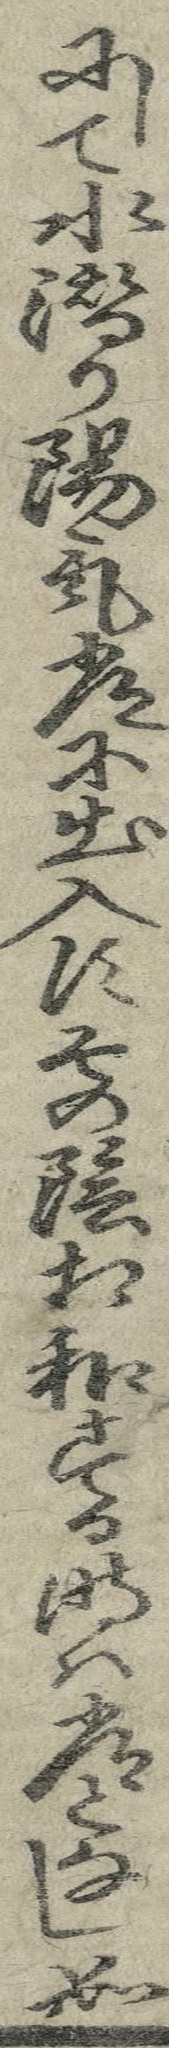にして水潜り陽気常に出入すその陰相和する時は常となし如
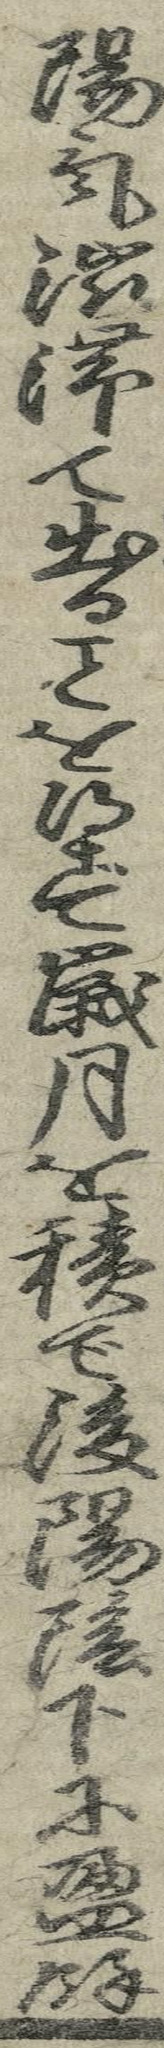陽気渋滞て出ることを得ず歳月を積で後陽陰下に盈余
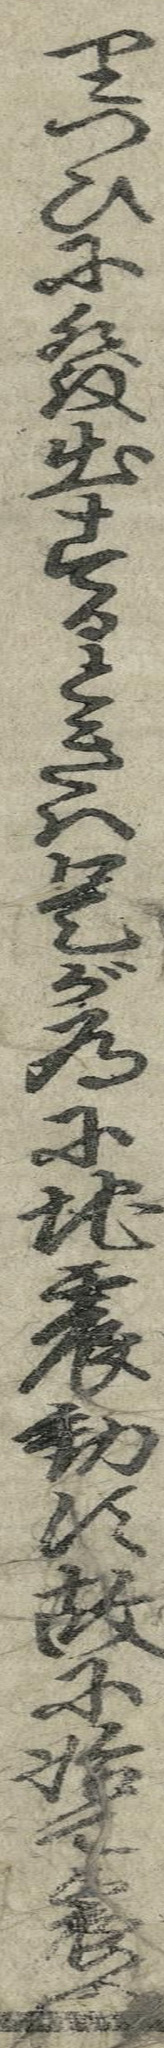りつひに発出するときは是が為に地震動す故に始て震ふ
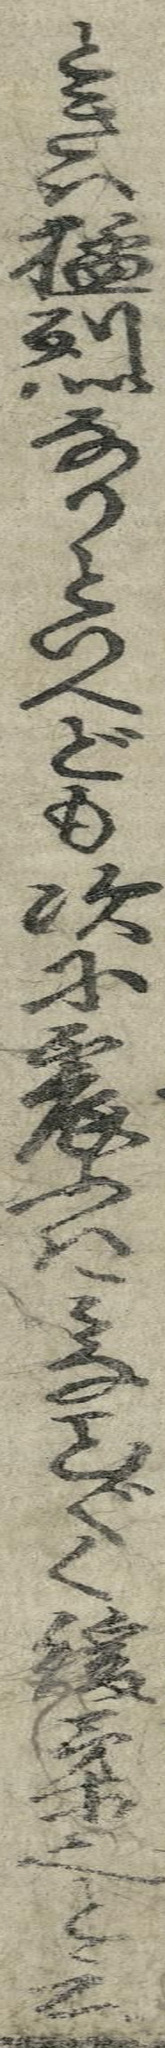ときは猛烈なりといへども次に震ふはみなこと〴〵く緩柔也と云

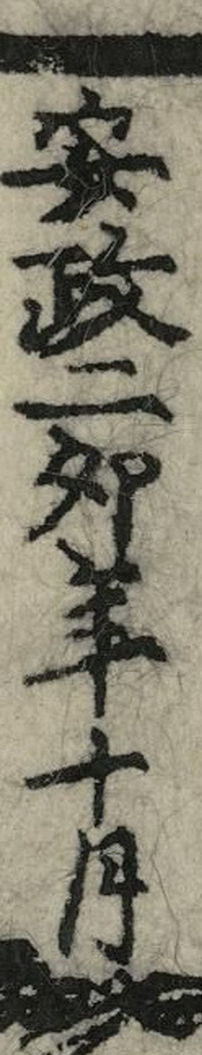安政二卯年十月
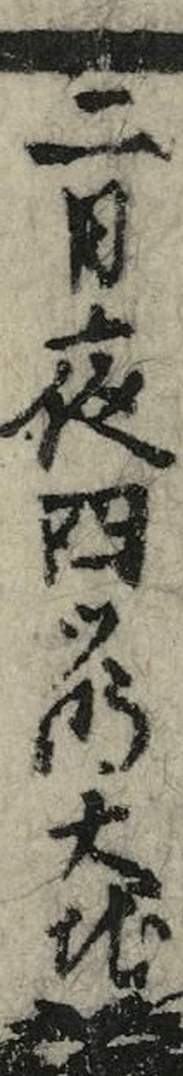二日夜四ツ時大地
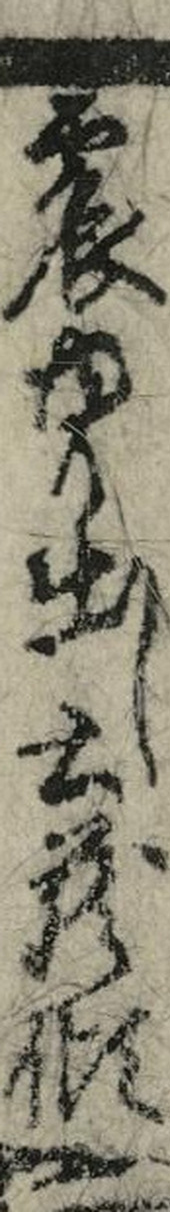震ゆり出し土蔵傾
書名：江戸　大地震末代噺の種　全
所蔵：東京大学地震研究所図書室 Earthquake Research Institute Library, The University of Tokyo, JAPAN
